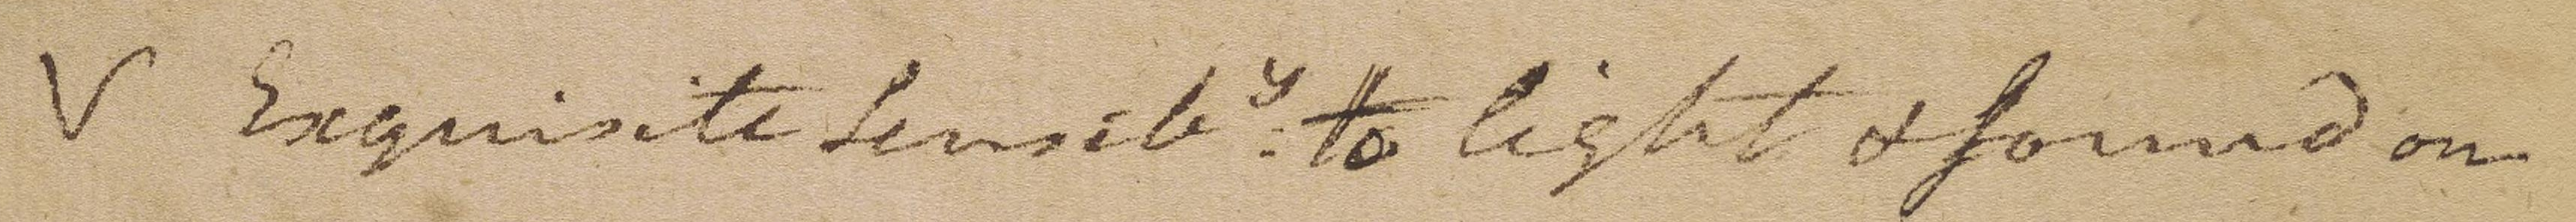V Exquisite sensib^y to light & found on
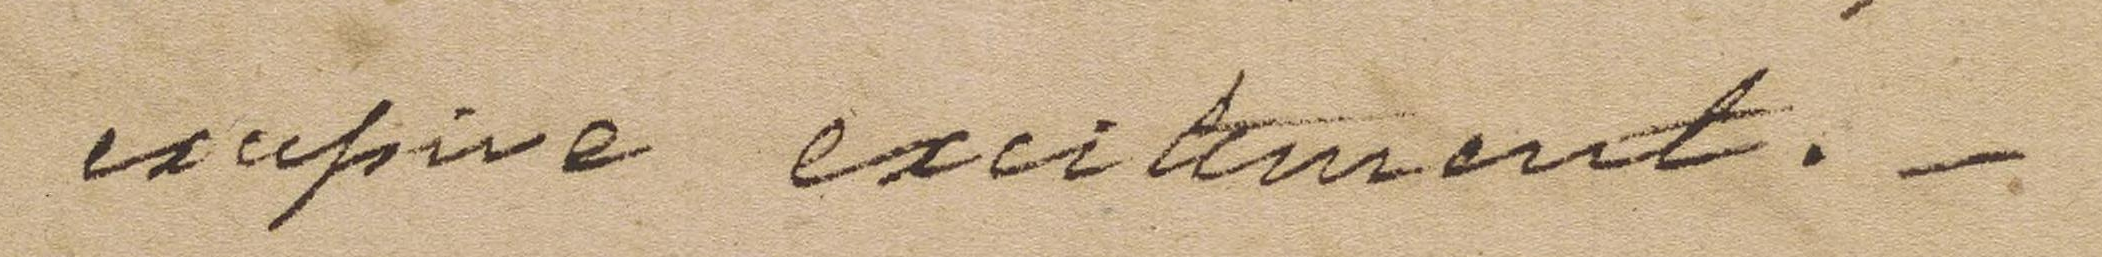excessive excitement.
